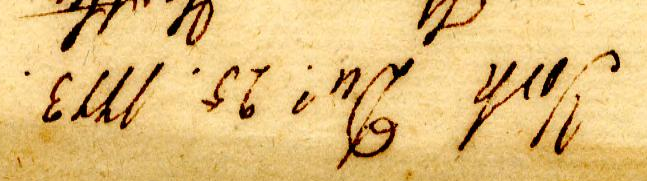York Dec^r. 25. 1773.
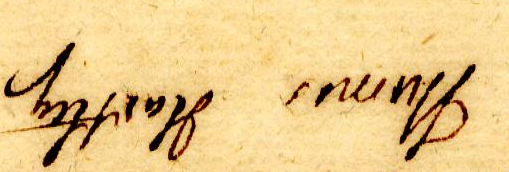Thomas Hartley
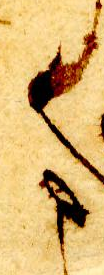To
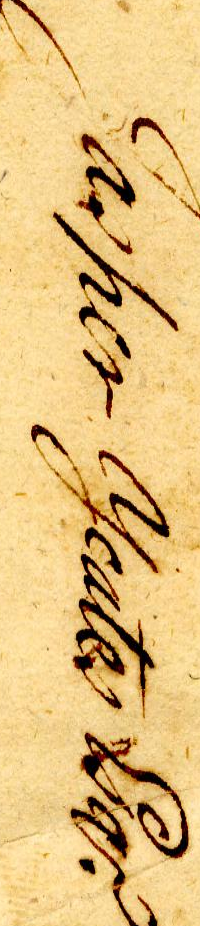Jasper Yeates Esq^r.
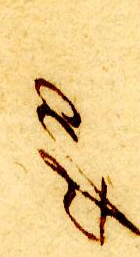at
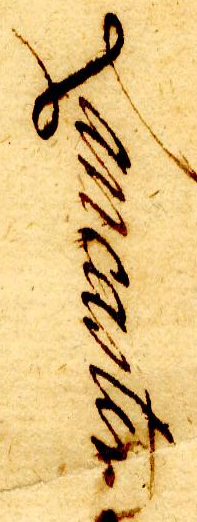Lancaster
